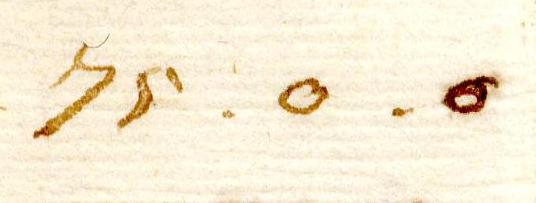75. 0.0
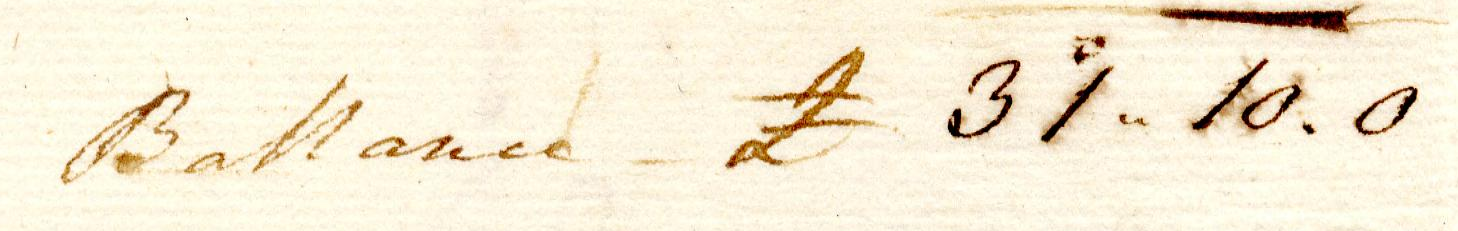Ballance £ 31.10.0
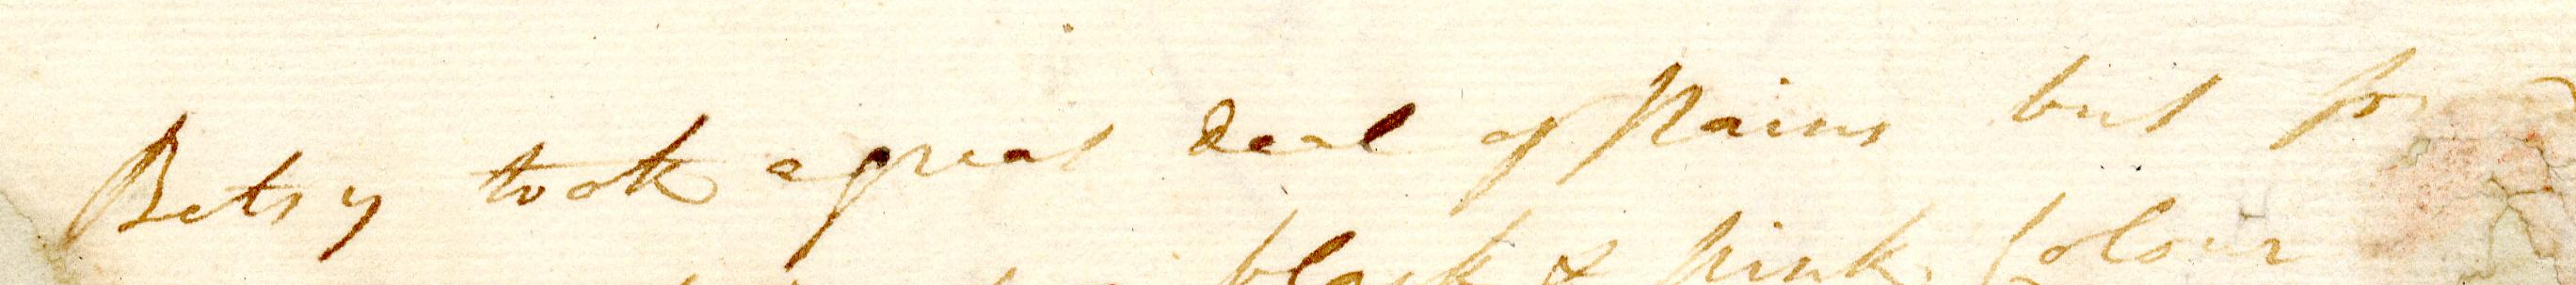Betsy took a great real of pains, but p-
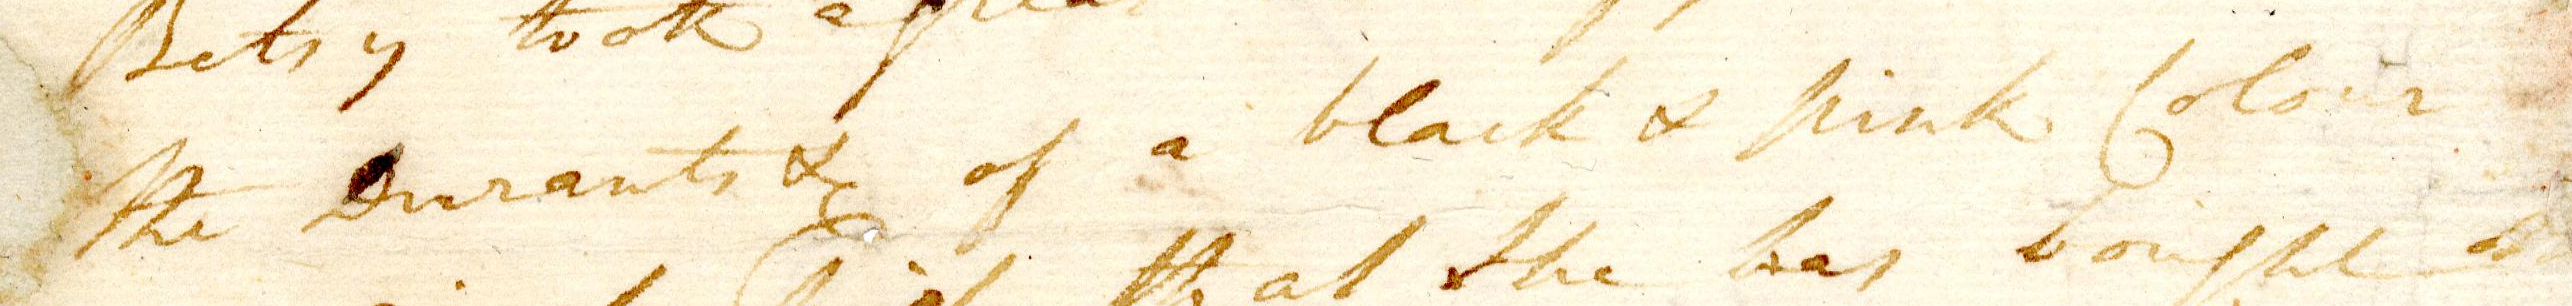the Durants &c. of a black & pink Colour
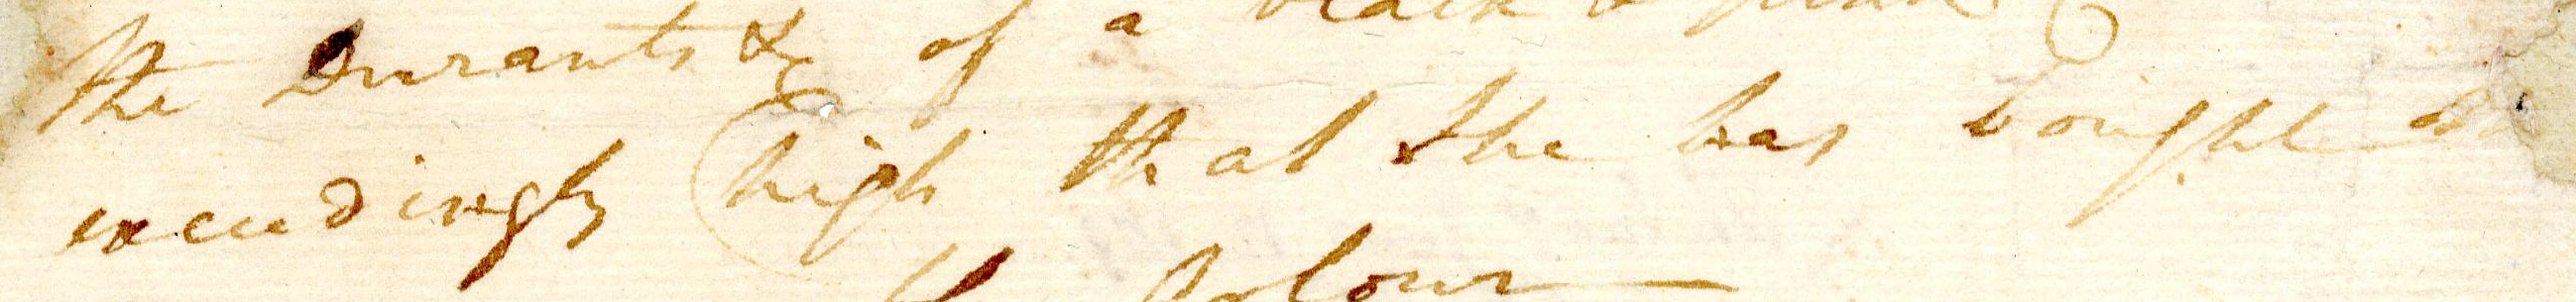excedingly high that she has bought of
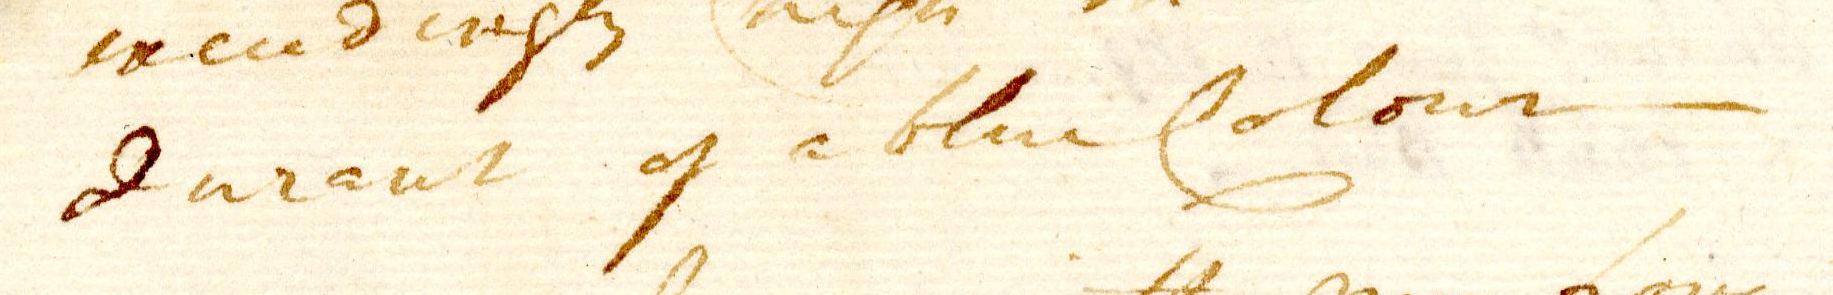durant of a blue Colour.
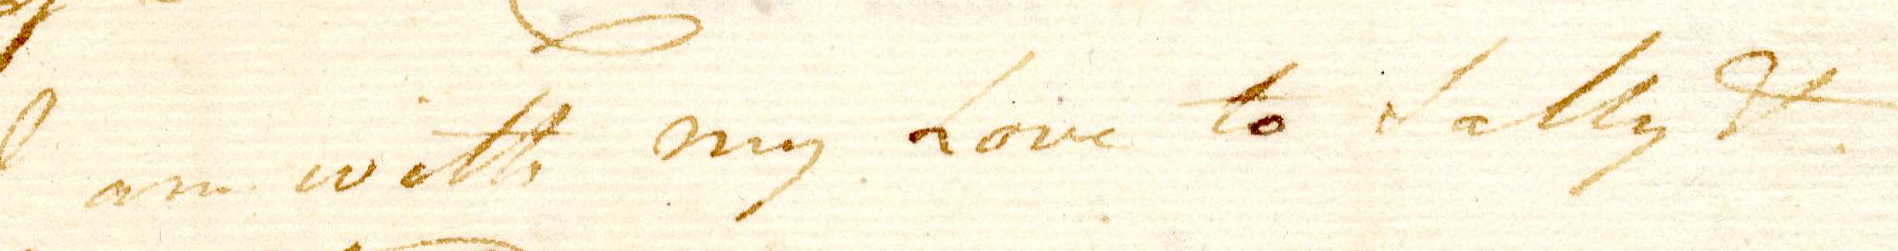I am with my Love to Sally &
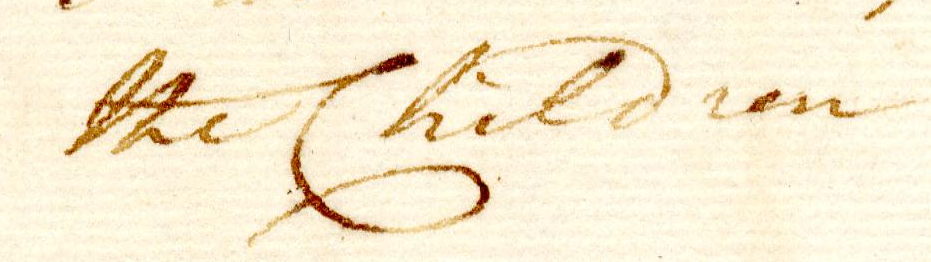the Children
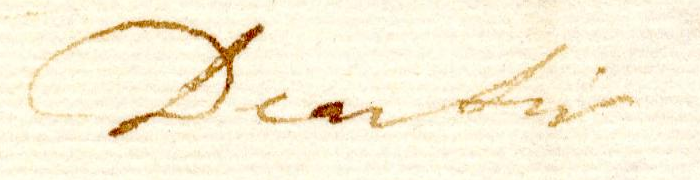Dear Sir
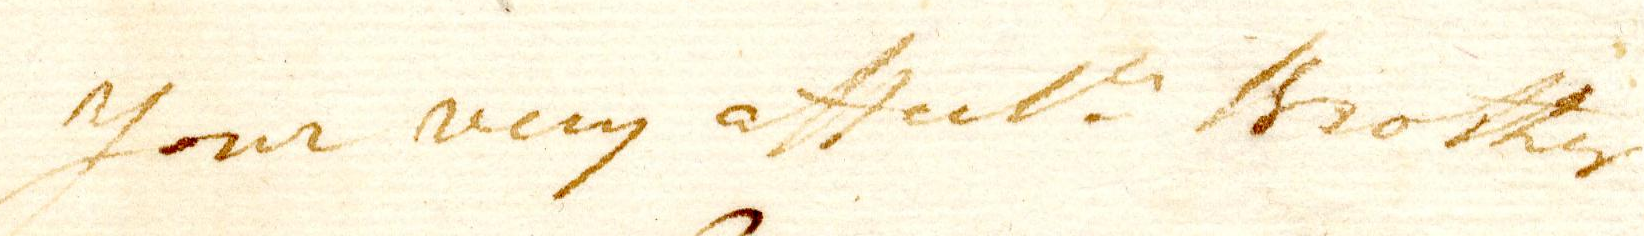Your very affect^e Brother
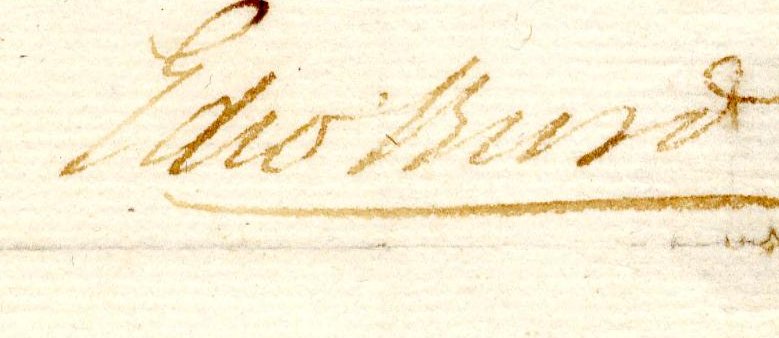Edw. Burd
